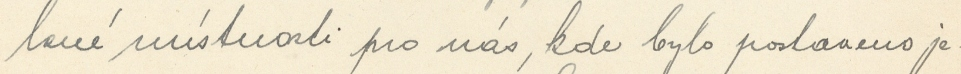lené místnosti pro nás, kde bylo postaveno je-
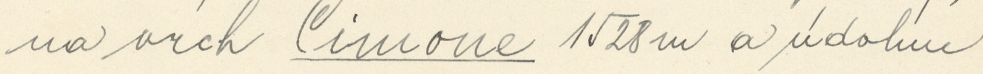na vrch Cimone 1528 m a údolím
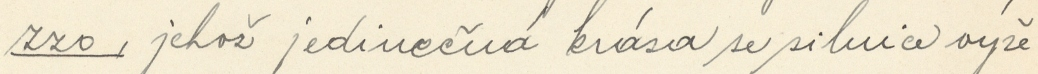zzo, jehož jedinečná krása se silnice výše
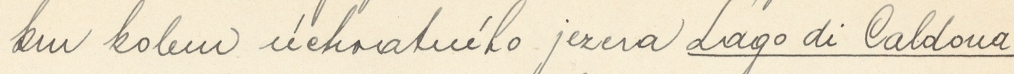km kolem úchvatného jezera Lago di Caldona-
